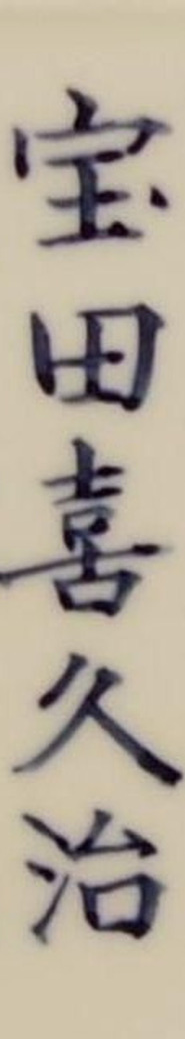宝田喜久治
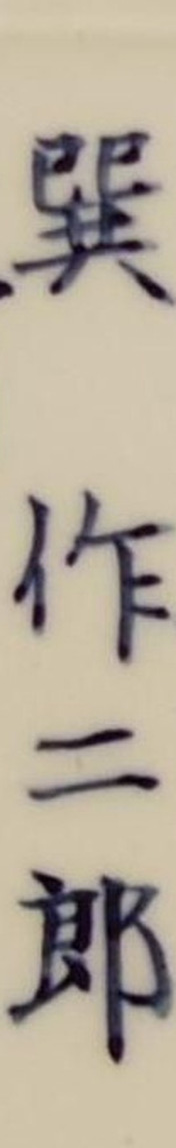巽作二郎
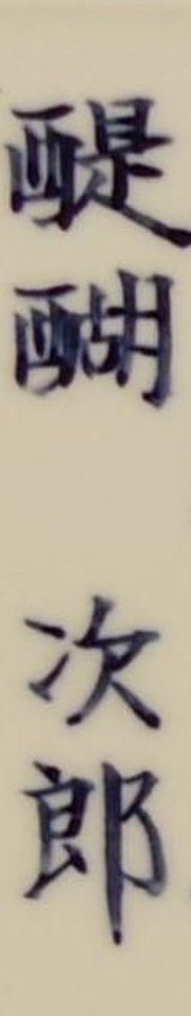醍醐次郎
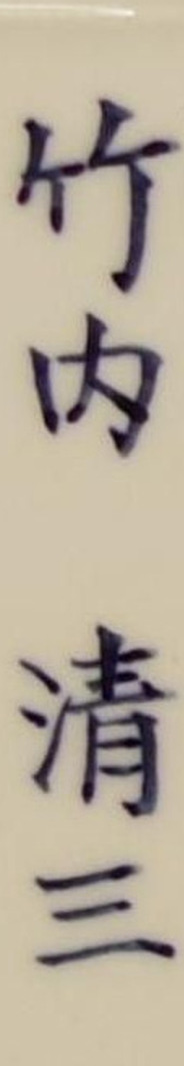竹内清三
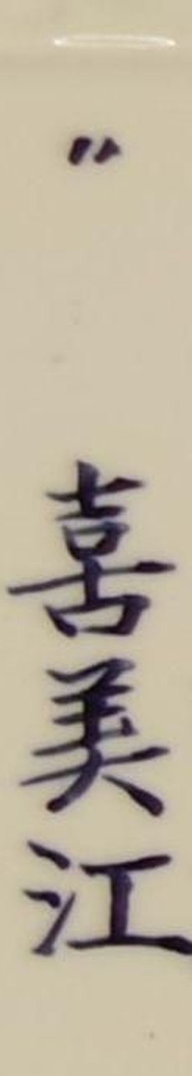喜美江
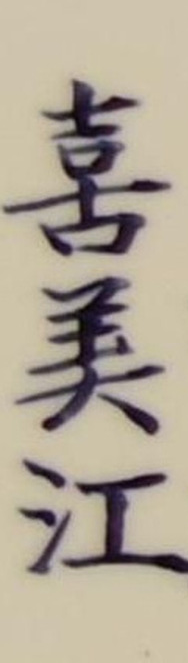喜美江
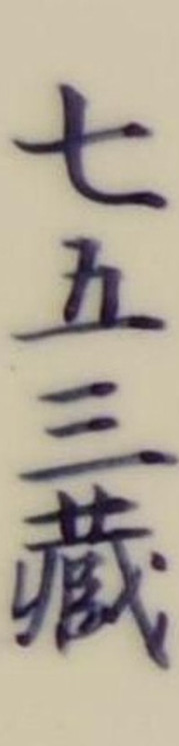七五三蔵

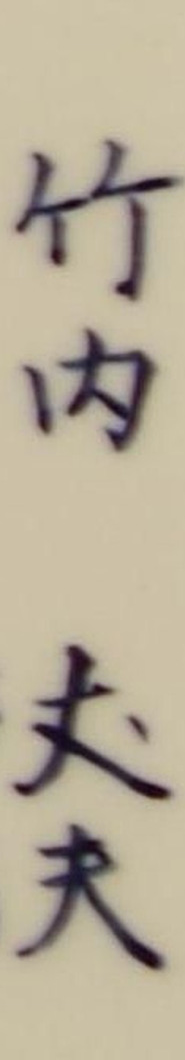竹内丈夫
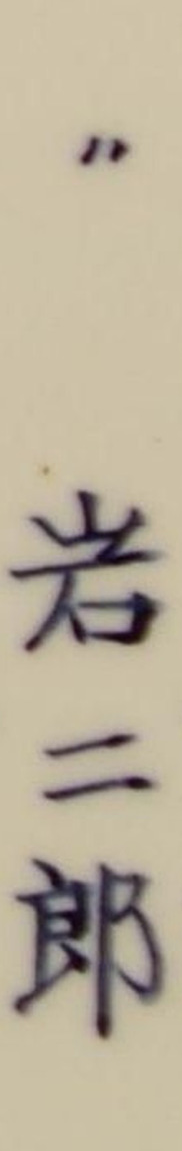岩二郎
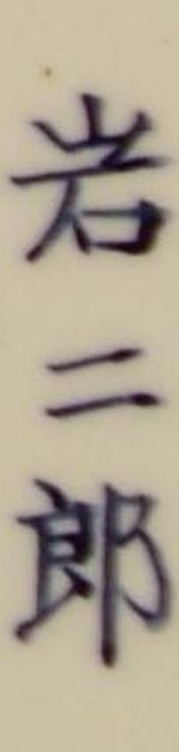岩二郎
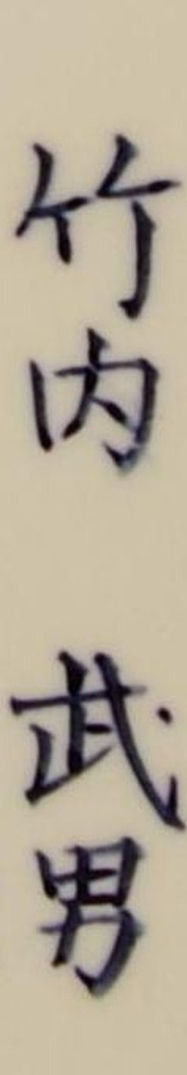竹内武男
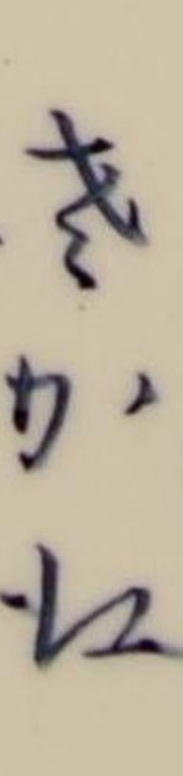さか江
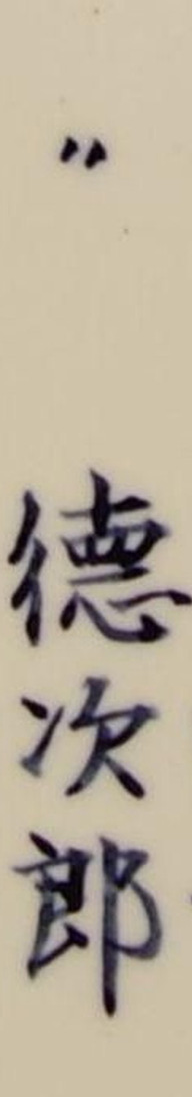徳次郎
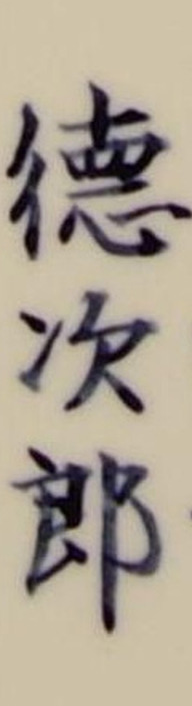徳次郎
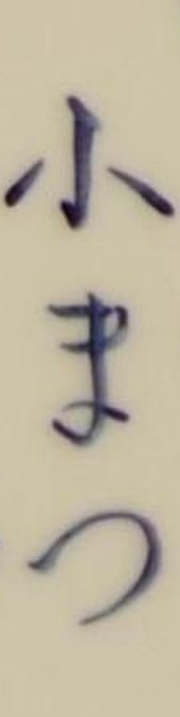小まつ

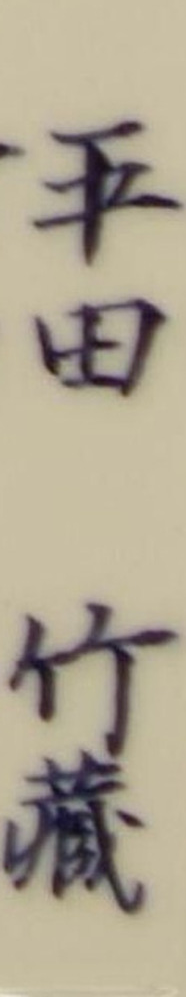平田竹蔵
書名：E~L
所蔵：高野山金剛峯寺
